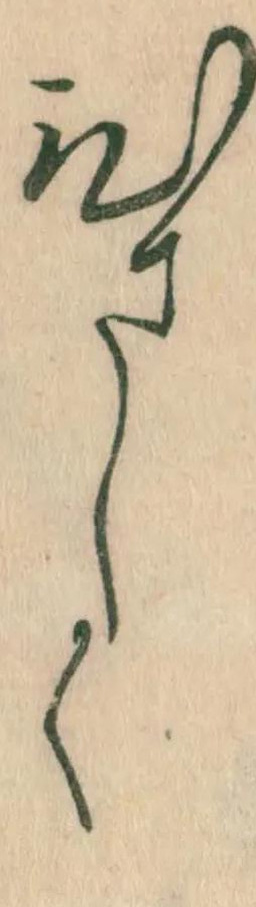ひさしく
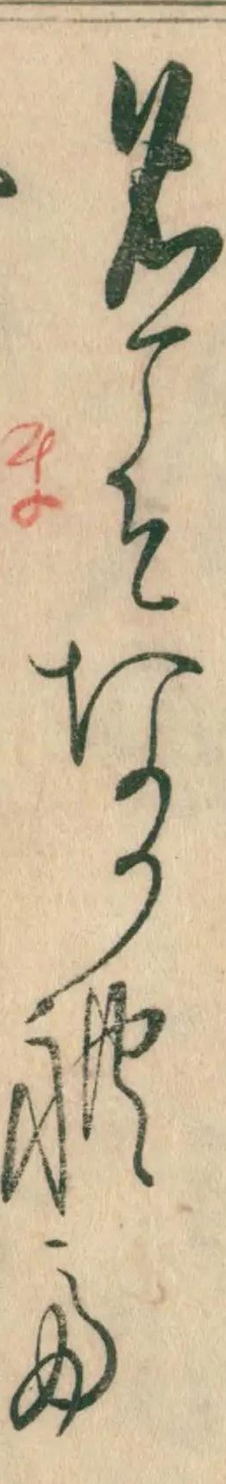名こそなかれて

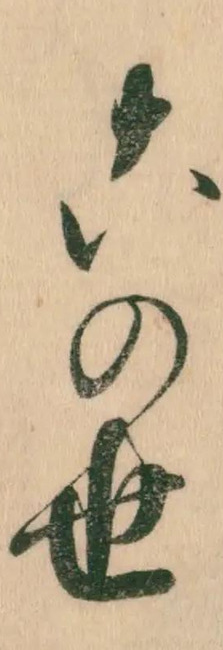この世
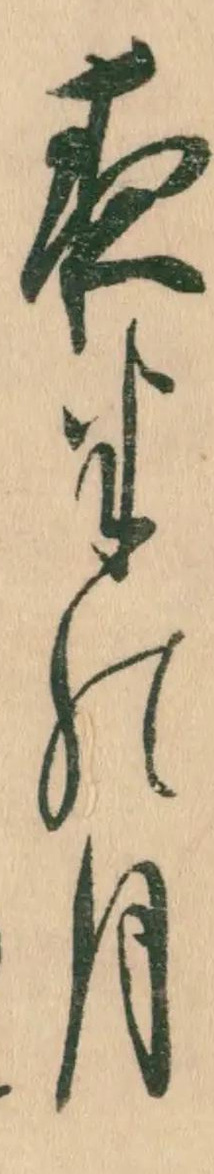夜半の月
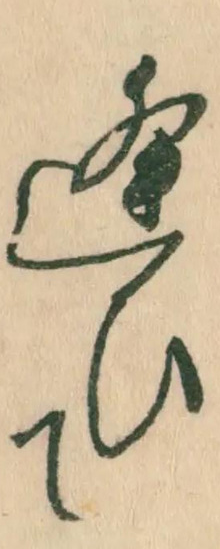逢ひて

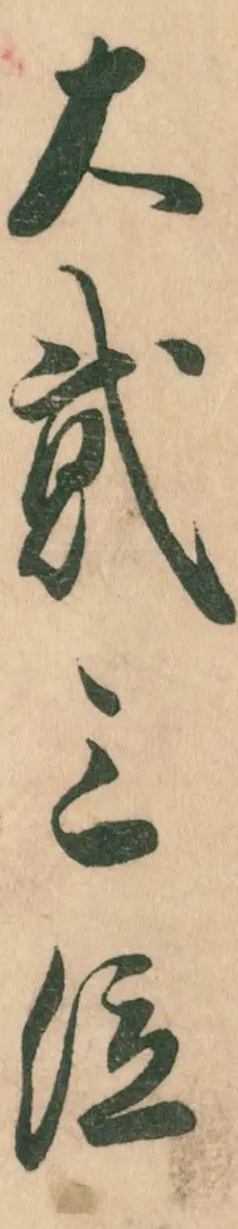大弐三位
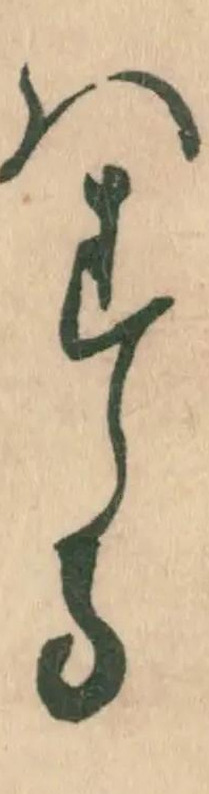はする
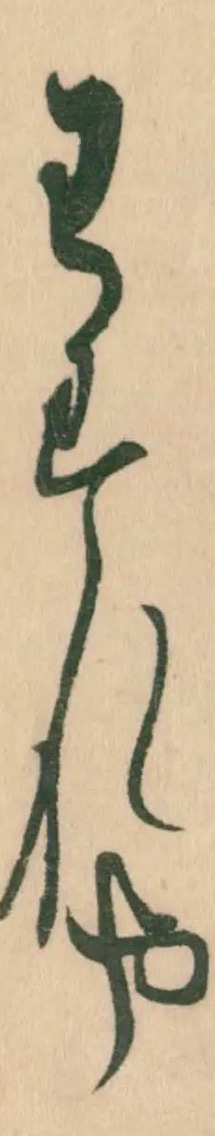わすれや
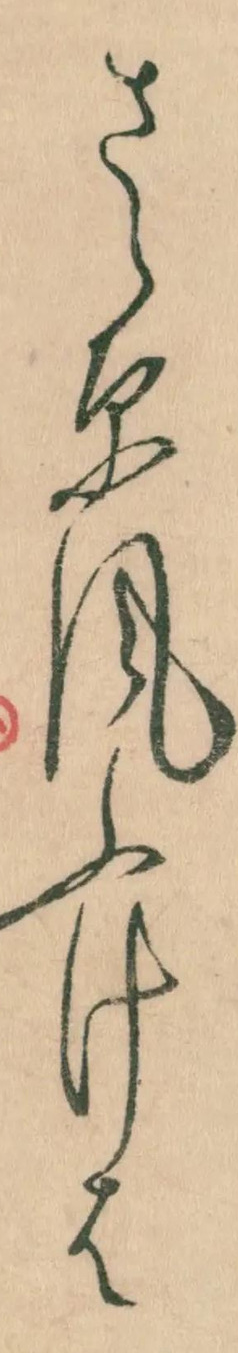さゝ原風ふけは
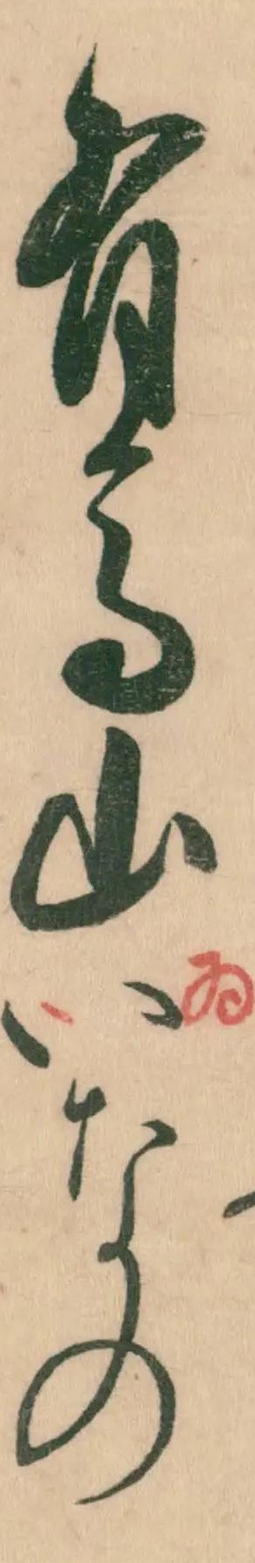有馬山いなの
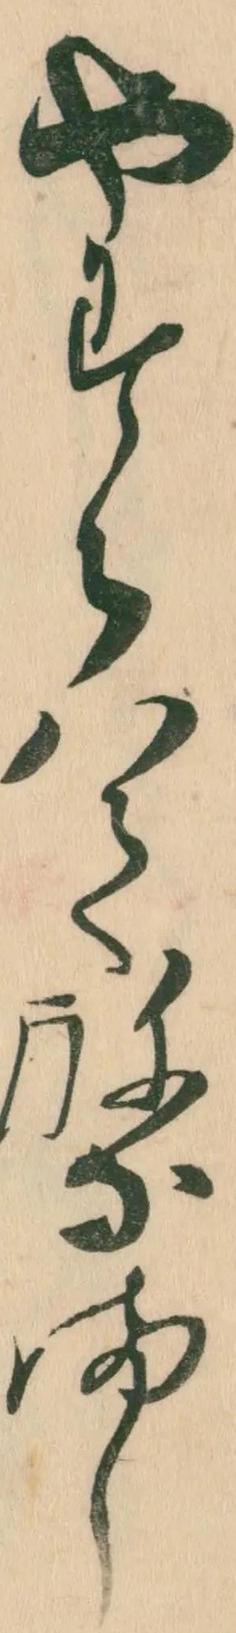やすらはてねなまし
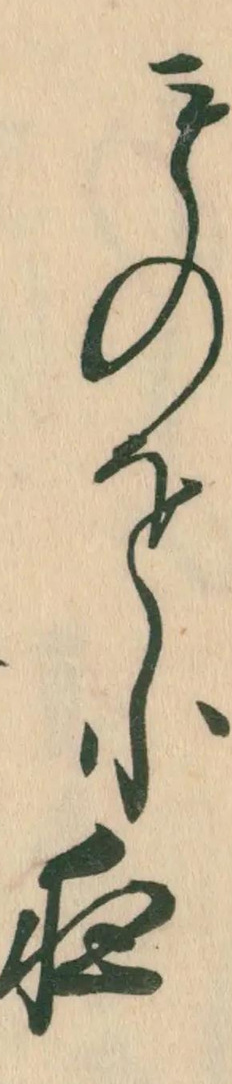ものを小夜

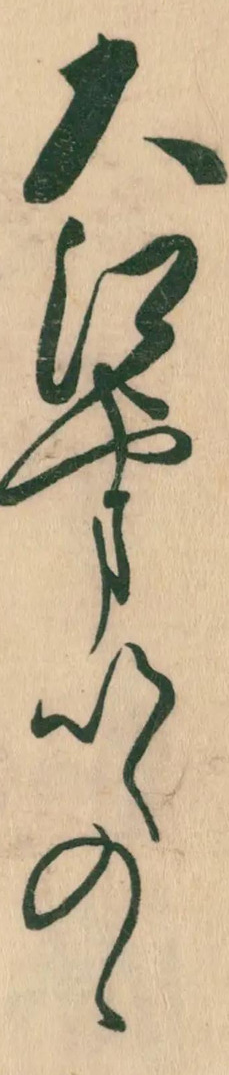大江やまいくのゝ
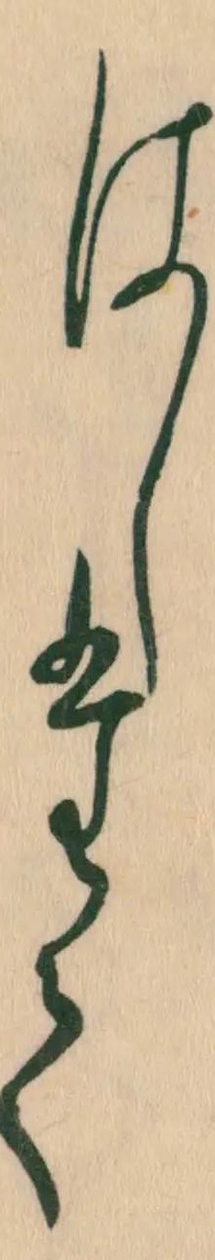はしたて
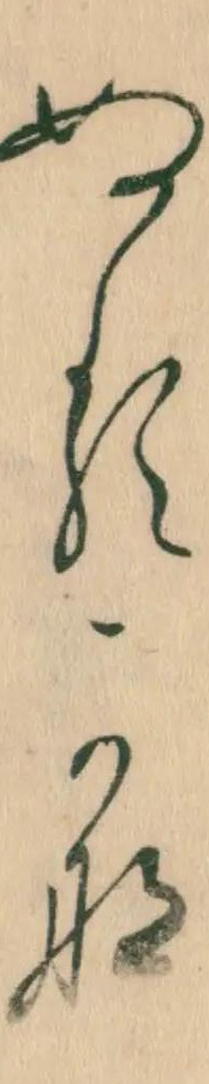ぬるかな
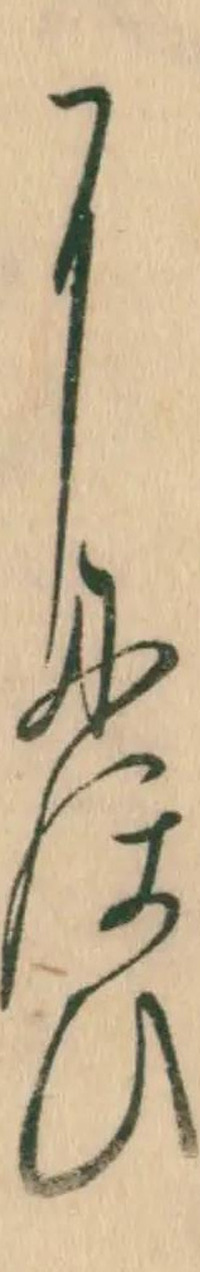ににほひ
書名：錦百人一首あつま織
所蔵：国立国会図書館 National Diet Library, JAPAN
